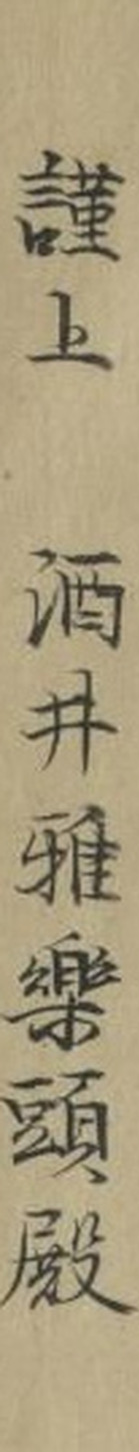謹上酒井雅楽頭殿

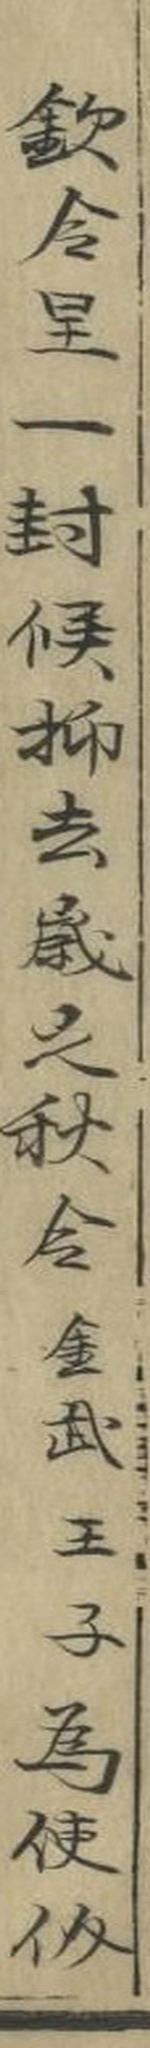欽令呈一封候抑去歳之秋令金武王子為使价
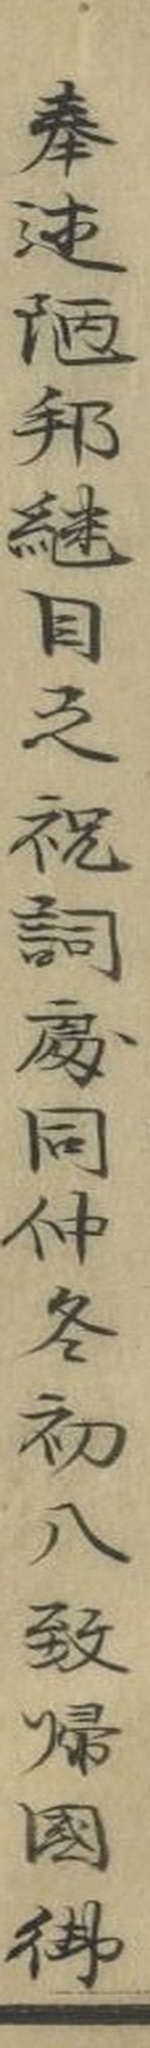奉述陋邦継目之祝詞處同仲冬初八致帰国御
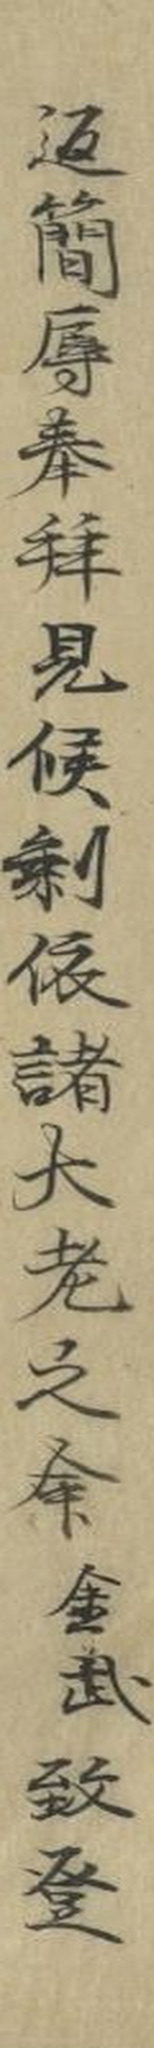返簡辱奉拝見候剰依諸大老之命金武致登
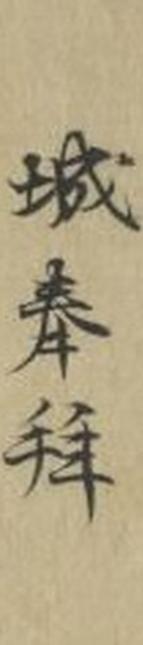城奉拝
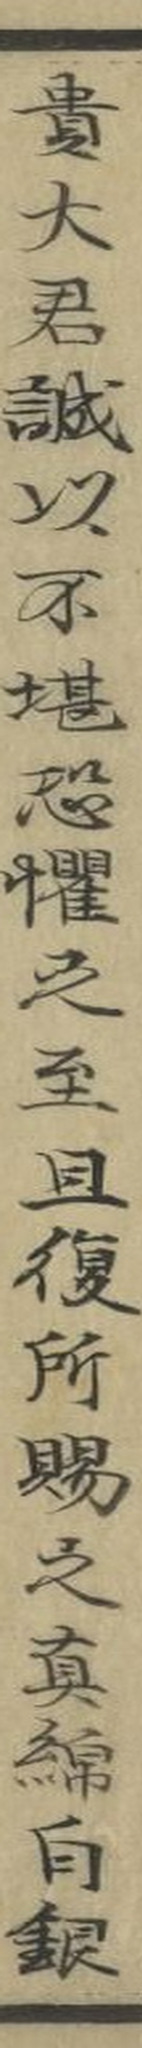貴大君誠以不堪恐懼之至且復所賜之真綿白銀
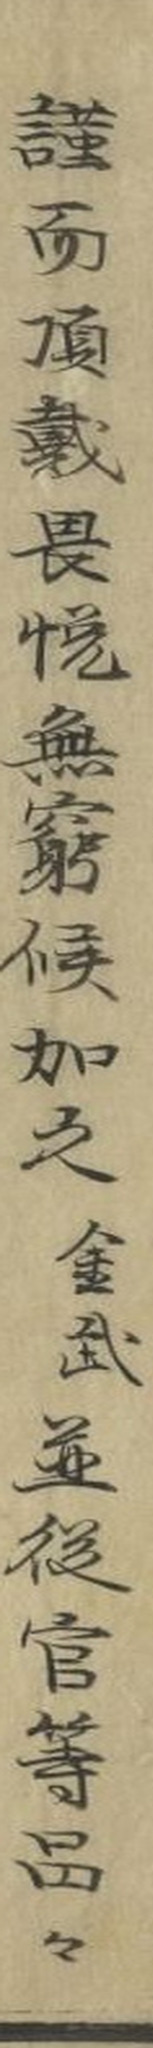謹而頂戴畏悦無窮候加之金武並従官等品々
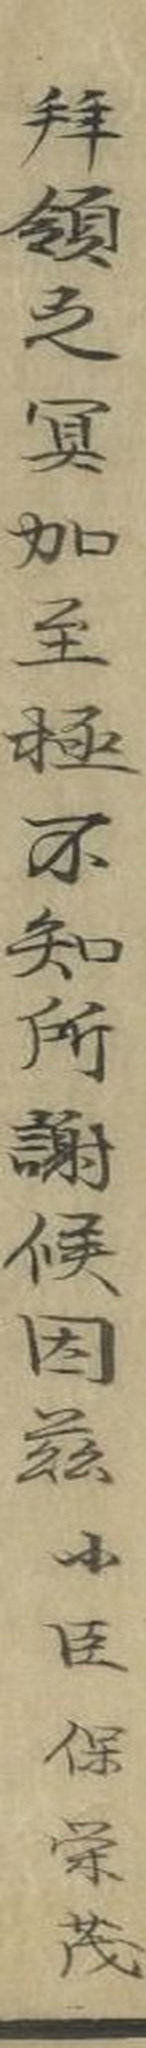拝領之冥加至極不知所謝候因茲小臣保栄茂
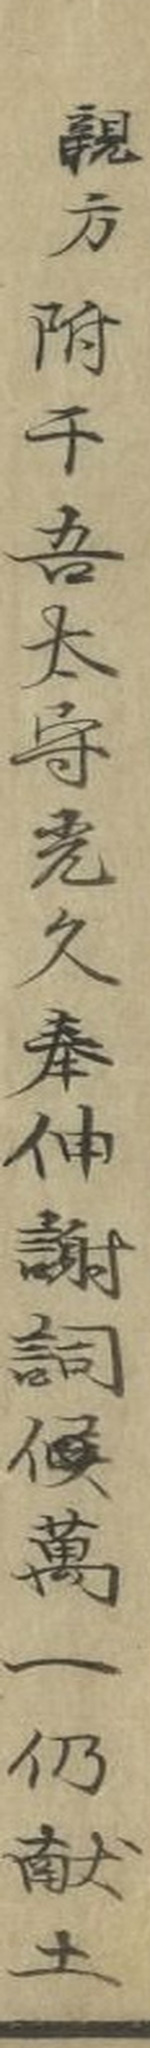親方附于吾太守充久奉伸謝詞候萬一仍献土
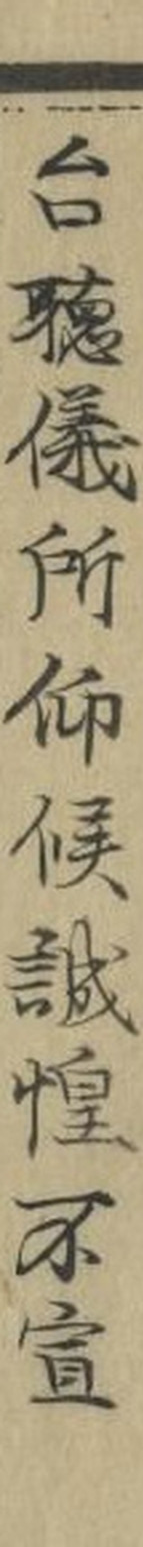台聴儀所抑候誠惶不宣
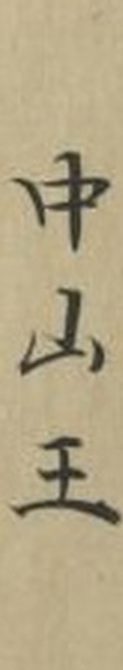中山王
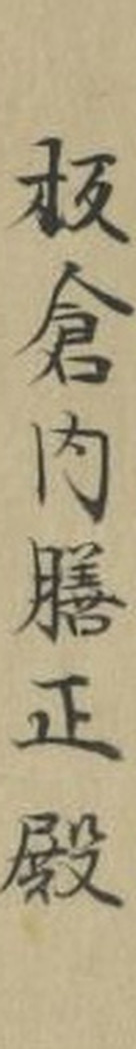板倉内膳正殿
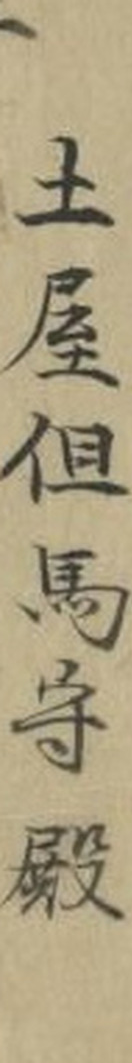土屋但馬守殿
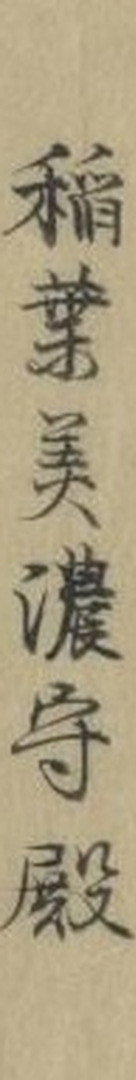稲葉美濃守殿
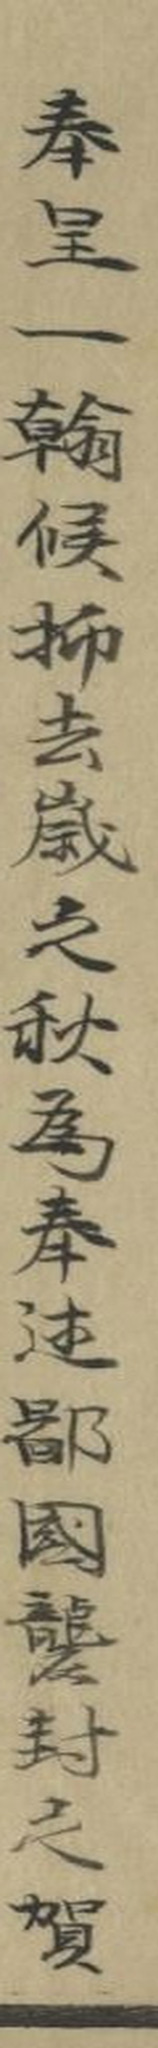奉呈一翰候抑去歳之秋為奉述鄙国襲封之賀
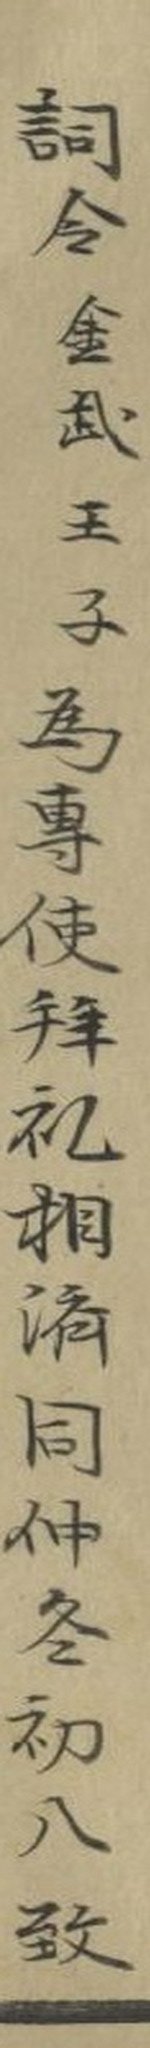詞令金武王子為専使拝礼相済同仲冬初八致
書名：琉球往来（下）
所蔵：University of the Ryukyus Library
